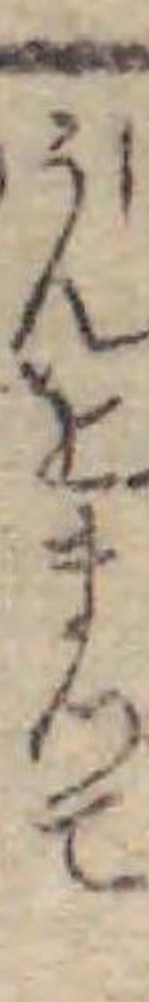うんをまつて
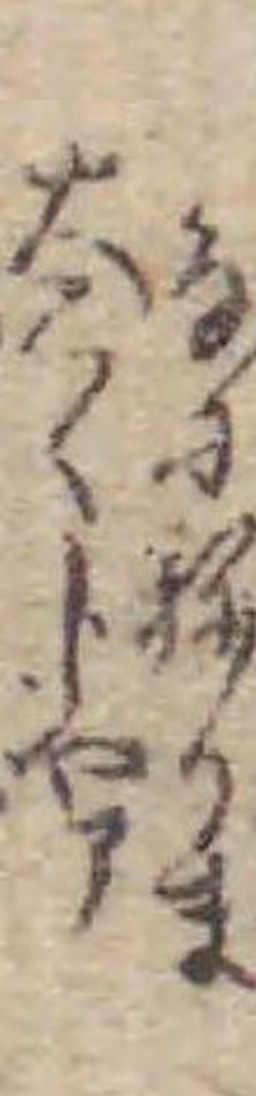大こくじやァ
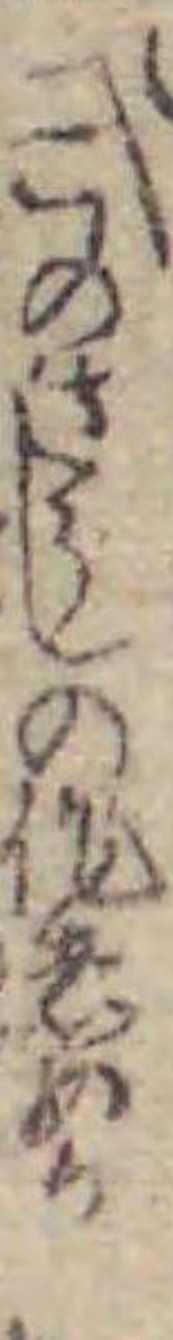〽このさうしの作者めか
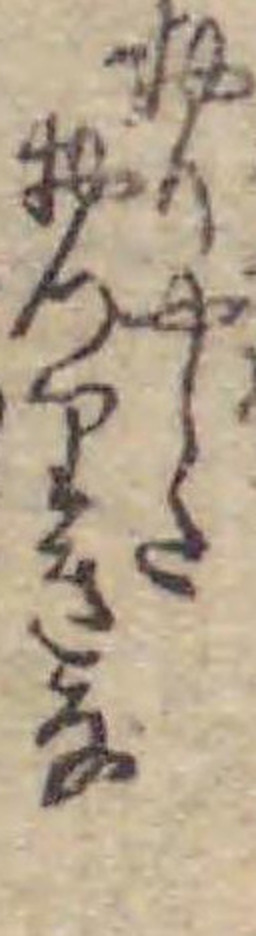おつりきな
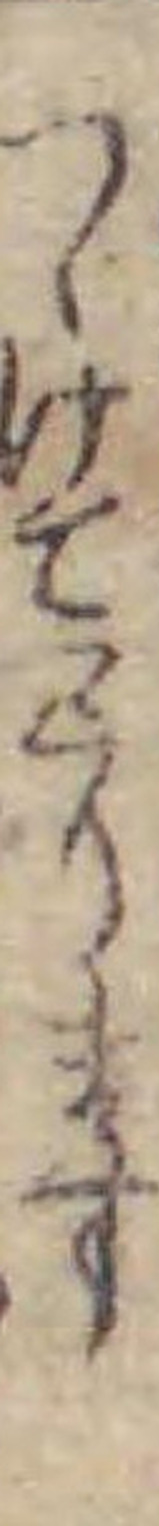つゝけてとります
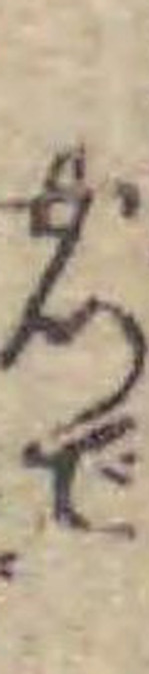やつで
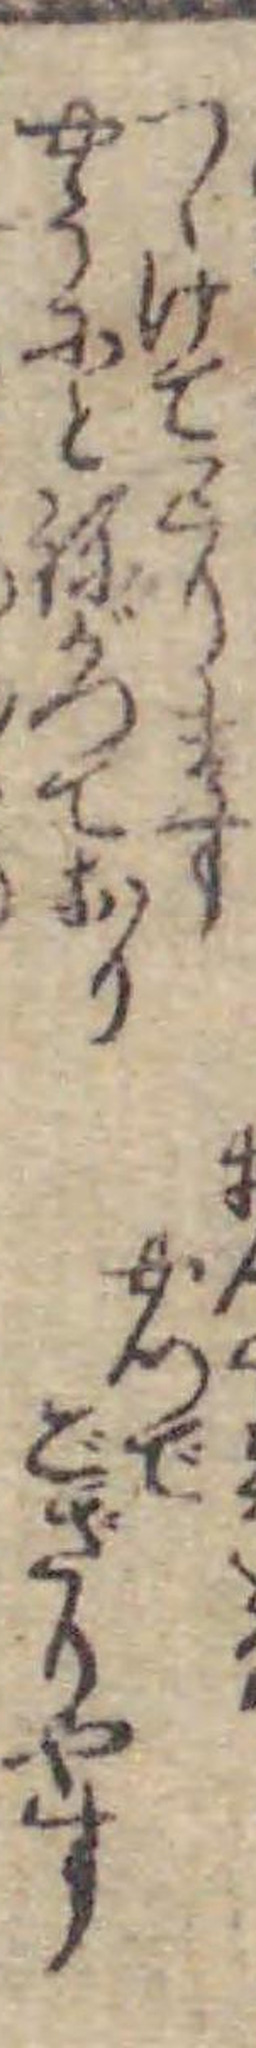やうにとねがつており
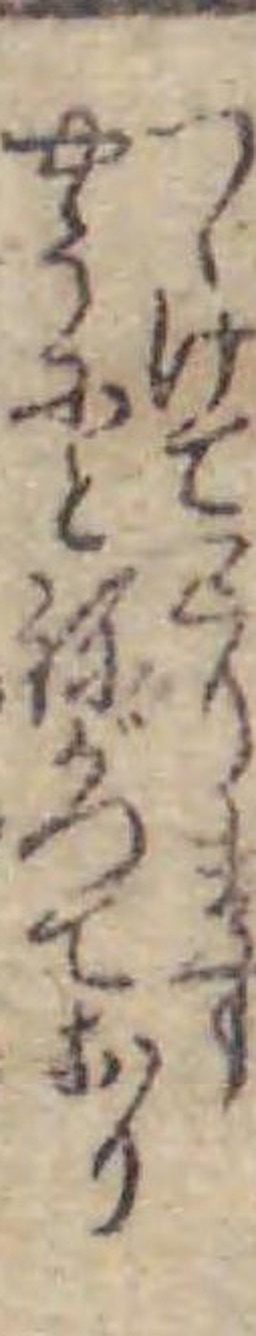やうにとねがつており
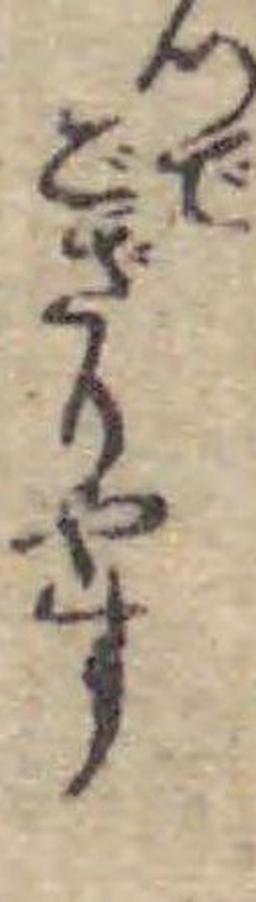ござりやす
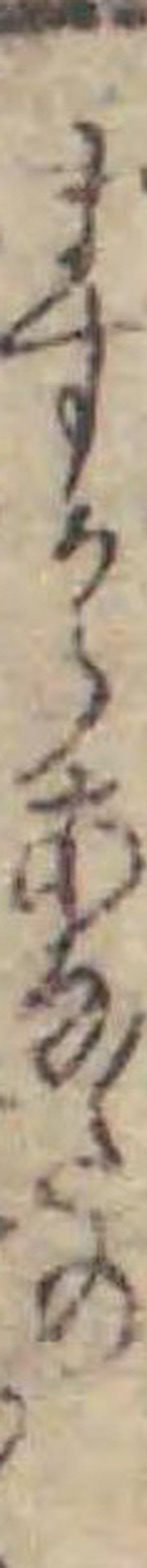ますからあなたの
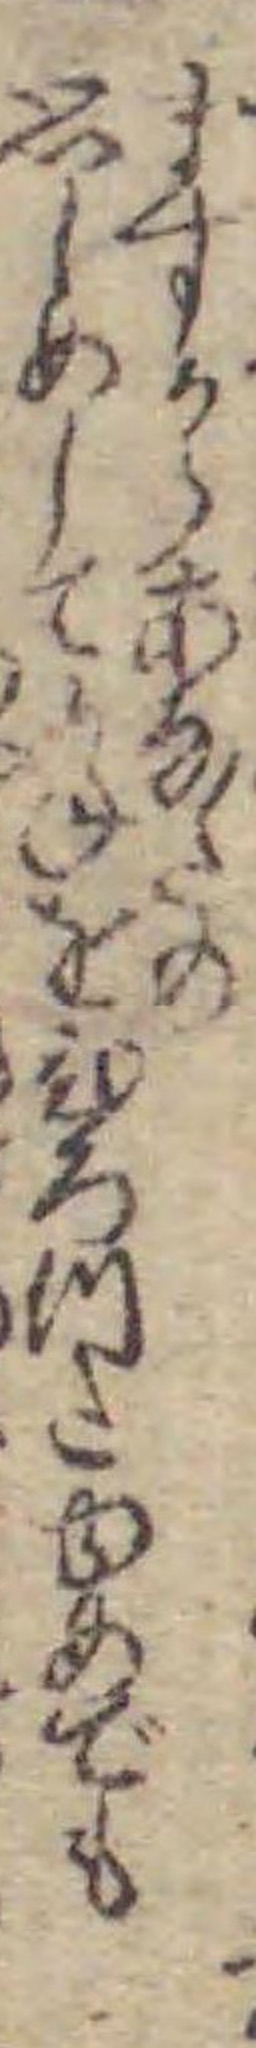思しめしてかねをひろつたゆめでも
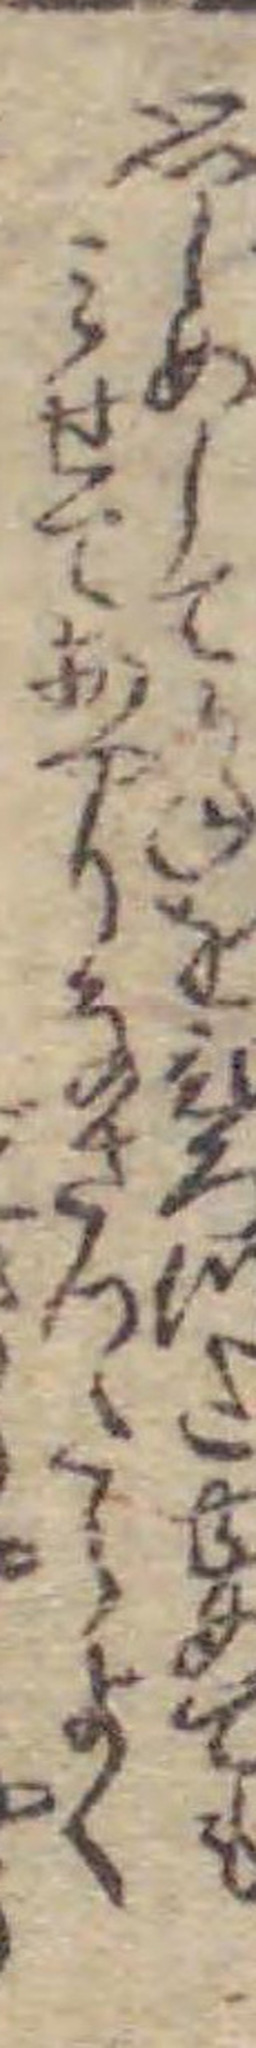みせておやりなさつたらよく
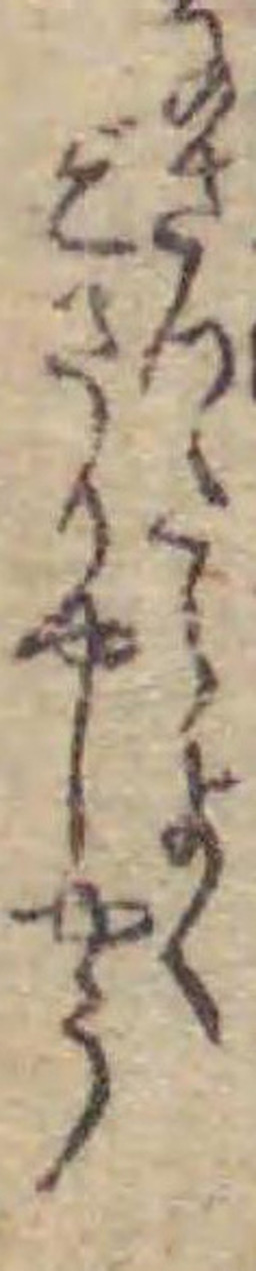ごさりやしやう
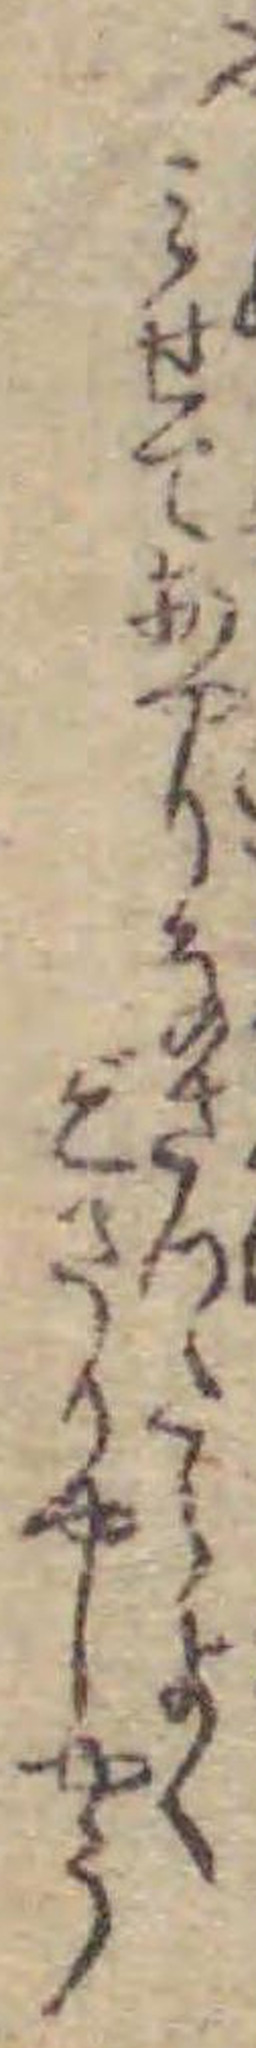ごさりやしやう

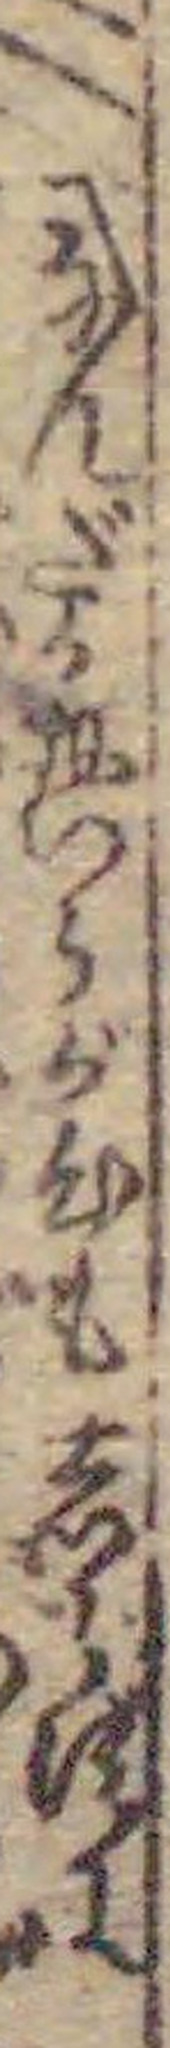〽なんだかおいらが心もしらずに
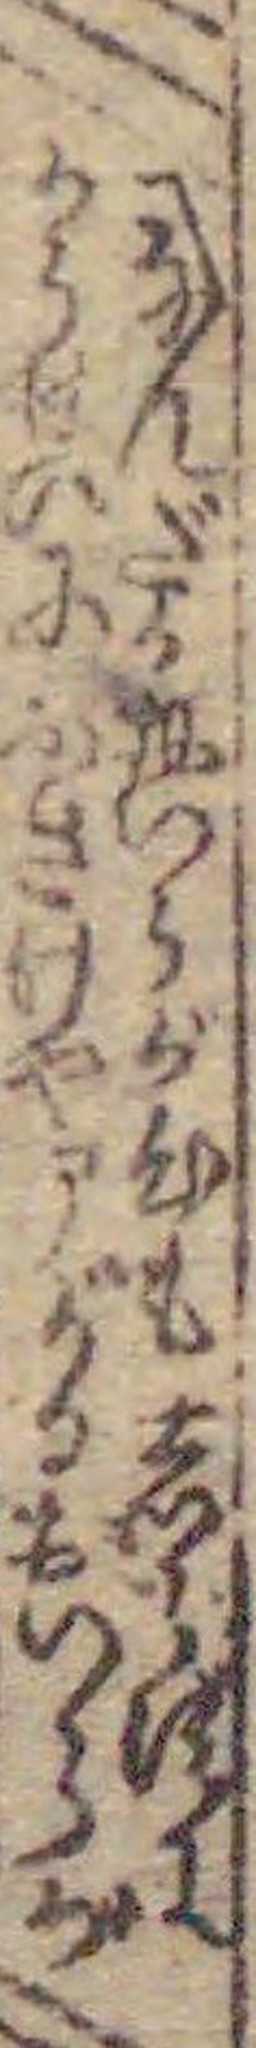かうせいにふさけやァがるおいらが
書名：新鋳小判 : 3巻
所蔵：国立国会図書館 National Diet Library, JAPAN
